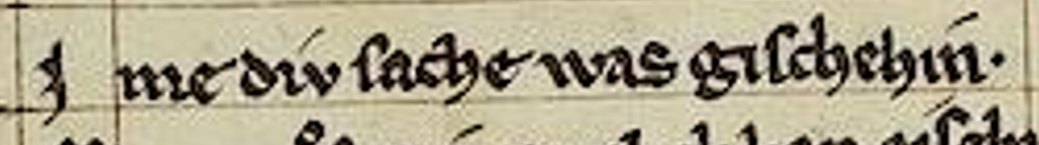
Ime div ſache was giſchehin.
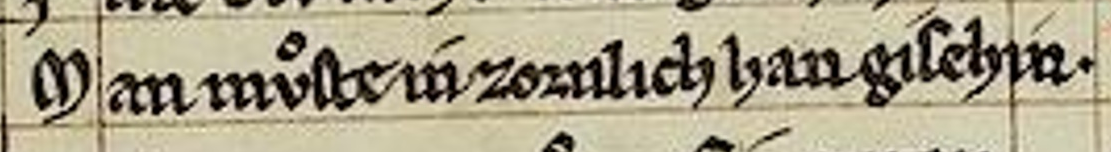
Man mv°oſte in zornlich han giſehin.
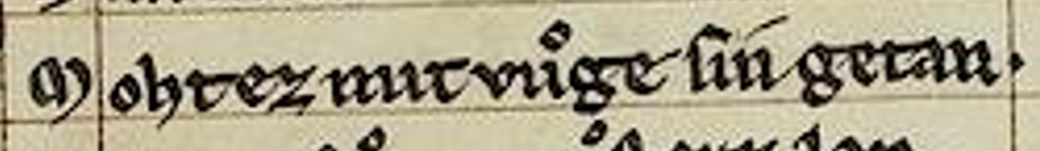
Mohtez mit vu°oge ſin getan.
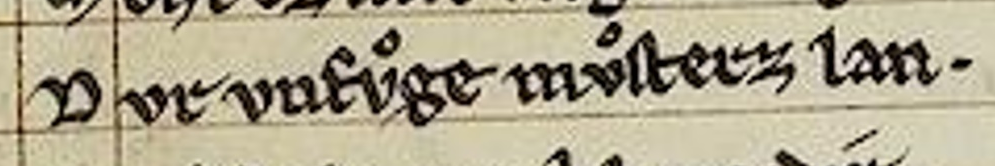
Dvr vnfv°oge mv°oſterz lan.
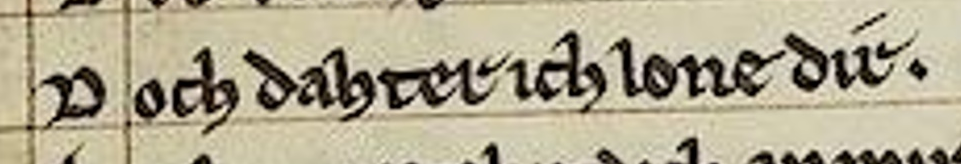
Doch dahter ich lone dir.
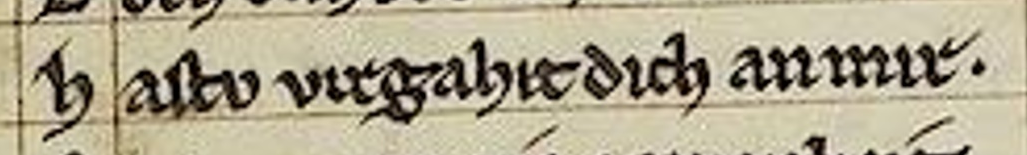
Haſtv virgahit dich an mir.
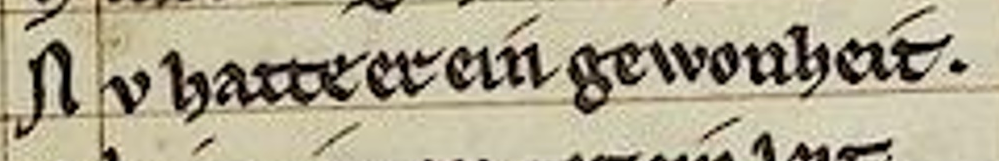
Nv hatte er ein gewonheit.
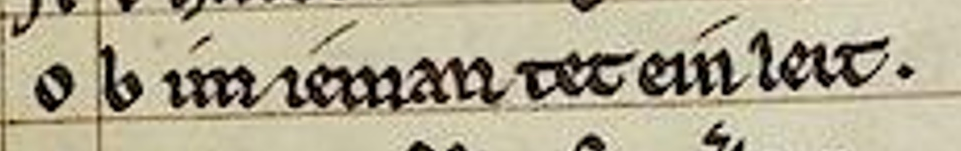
Ob im ieman tet ein leit.
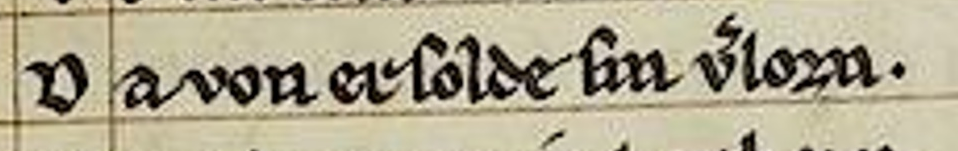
Da von er ſolde ſin v(er)lorn.
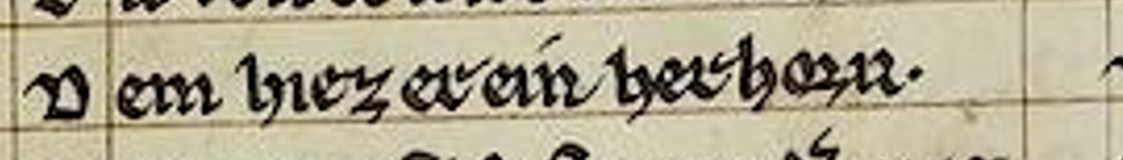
Dem hiez er ein herhorn.
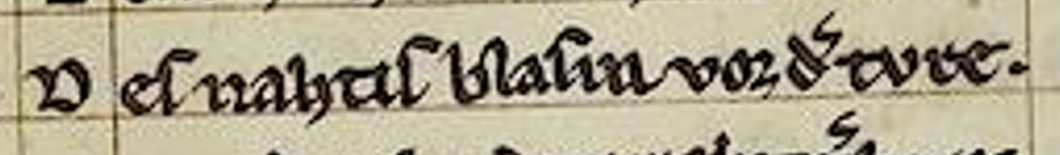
Deſ nahtiſ blaſin vor d(er) tvre.
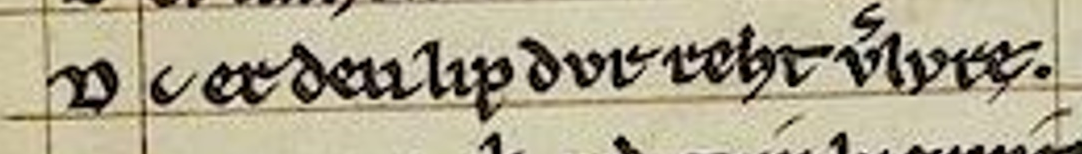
D(az) er den lip dvr reht v(er)lvre.
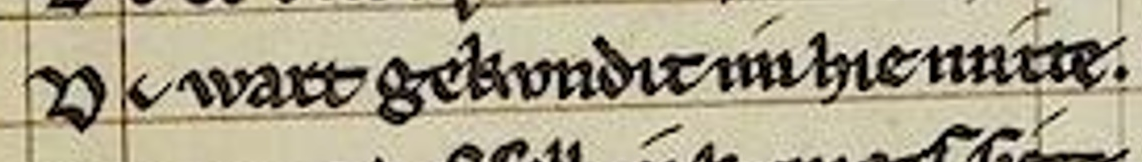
D(az) wart gekvndit im hie mitte.
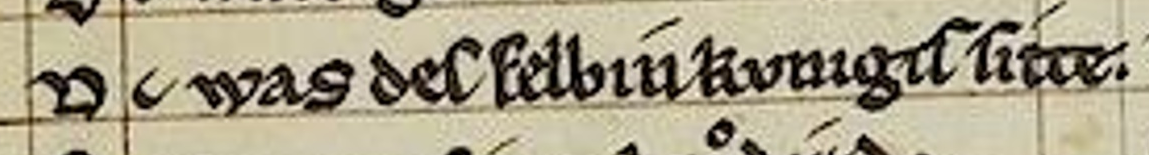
D(az) was deſ ſelbin kvnigiſ ſitte.
